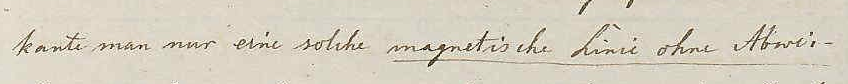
kante man nur eine solche magnetische Linie ohne Abwei-
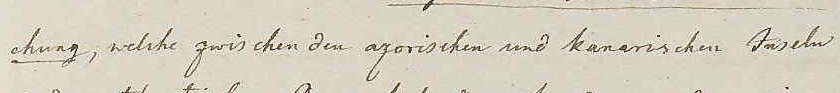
chung, welche zwischen den azorischen und kanarischen Inseln
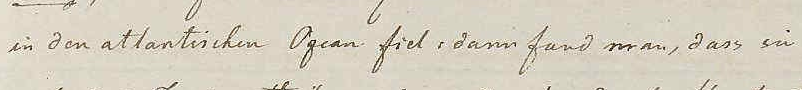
in den atlantischen Ozean fiel: dann fand man, dass sie
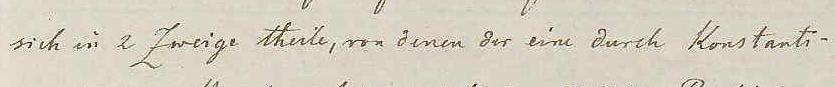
sich in 2 Zweige theile, von denen der eine durch Konstanti-
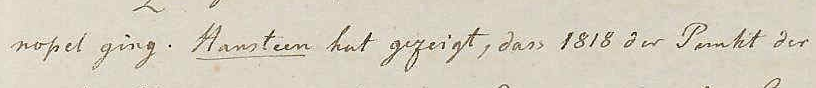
nopel ging. Hansteen hat gezeigt, dass 1818 der Punkt der
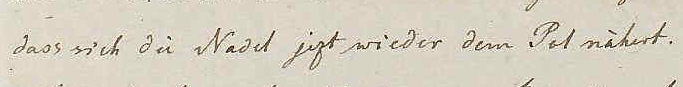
dass sich die Nadel jezt wieder dem Pol nähert.
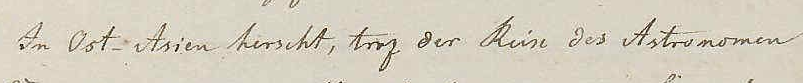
In Ost-Asien herscht, troz der Reise des Astronomen
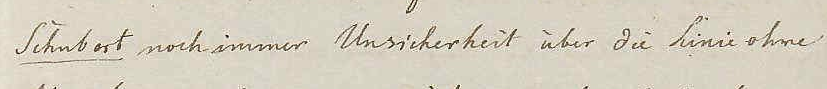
Schubert noch immer Unsicherheit über die Linie ohne
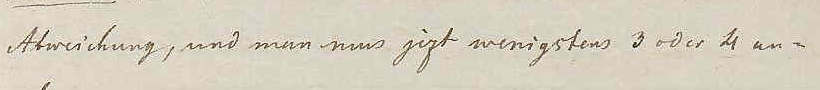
Abweichung, und man mus jezt wenigstens 3 oder 4 an-
